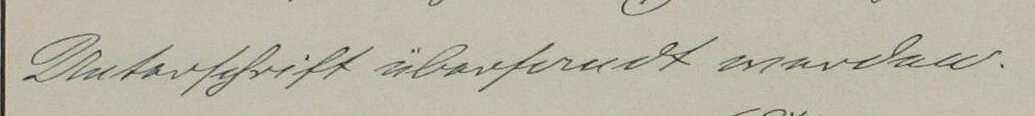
Unterschrift übersandt werden.
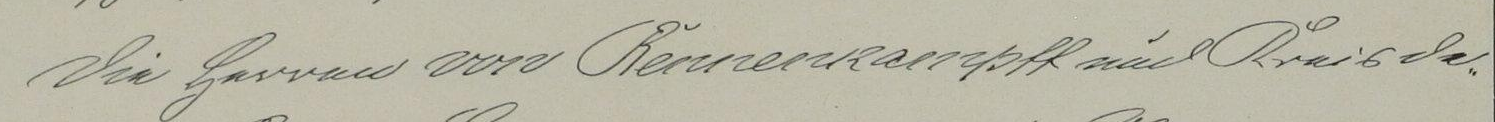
Die Herren von Rennenkampff und Kreisde-
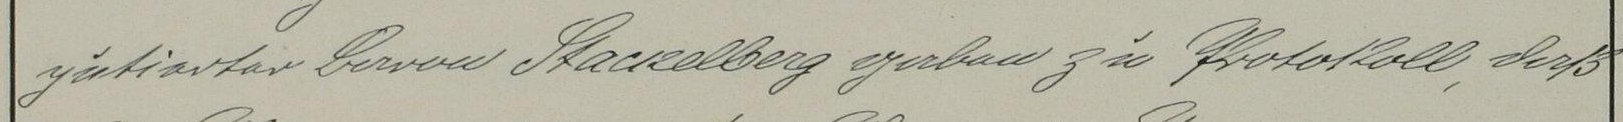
putierter Baron Stackelberg gaben zu Protokoll, daß
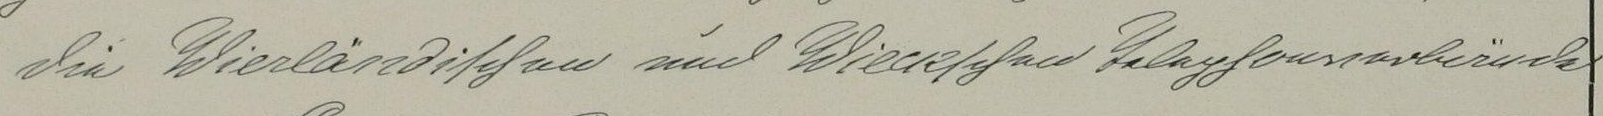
die Wierländischen und Wieckschen Telephonverbände
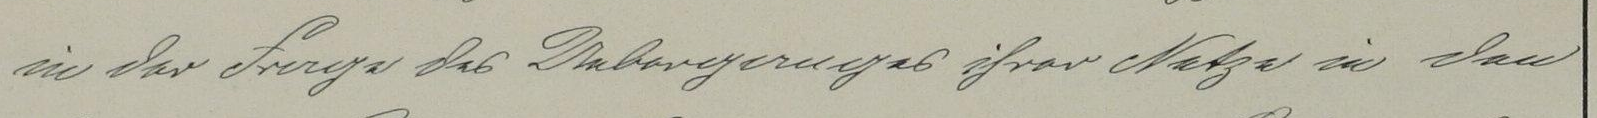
in der Frage des Ueberganges ihrer Netze in den
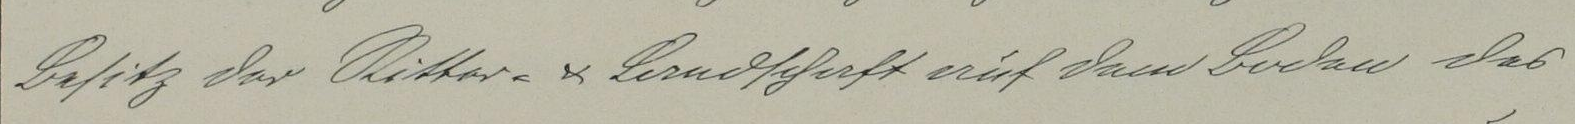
Besitz der Ritter- & Landschaft auf dem Boden des
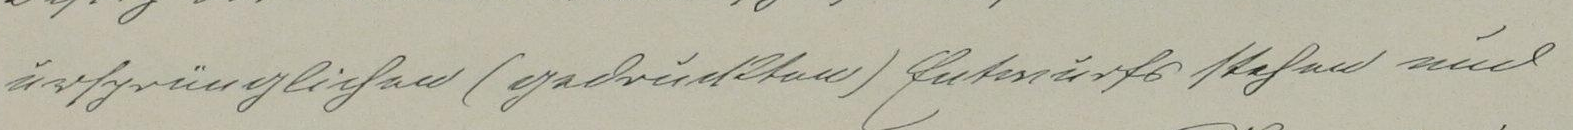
ursprünglichen (gedruckten) Entwurfs stehen und
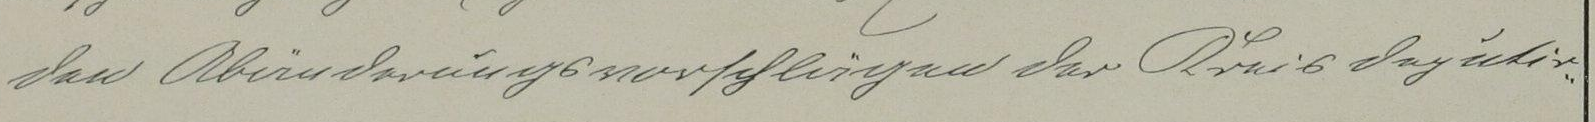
den Abänderungsvorschlägen der Kreisdeputir-
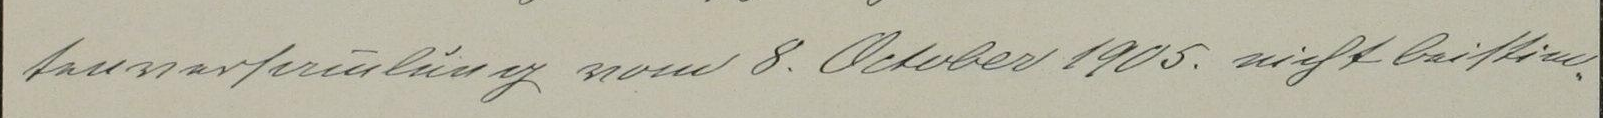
tenversammlung vom 8. October 1905. nicht beistim-
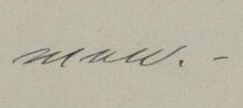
men.
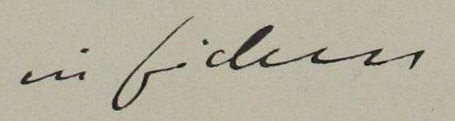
in fidem
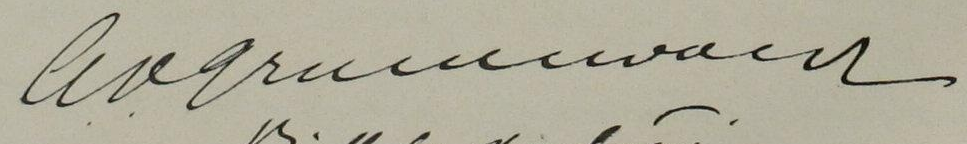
A. v. Gruenewaldt
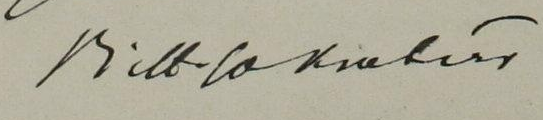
Ritt.sekretär
